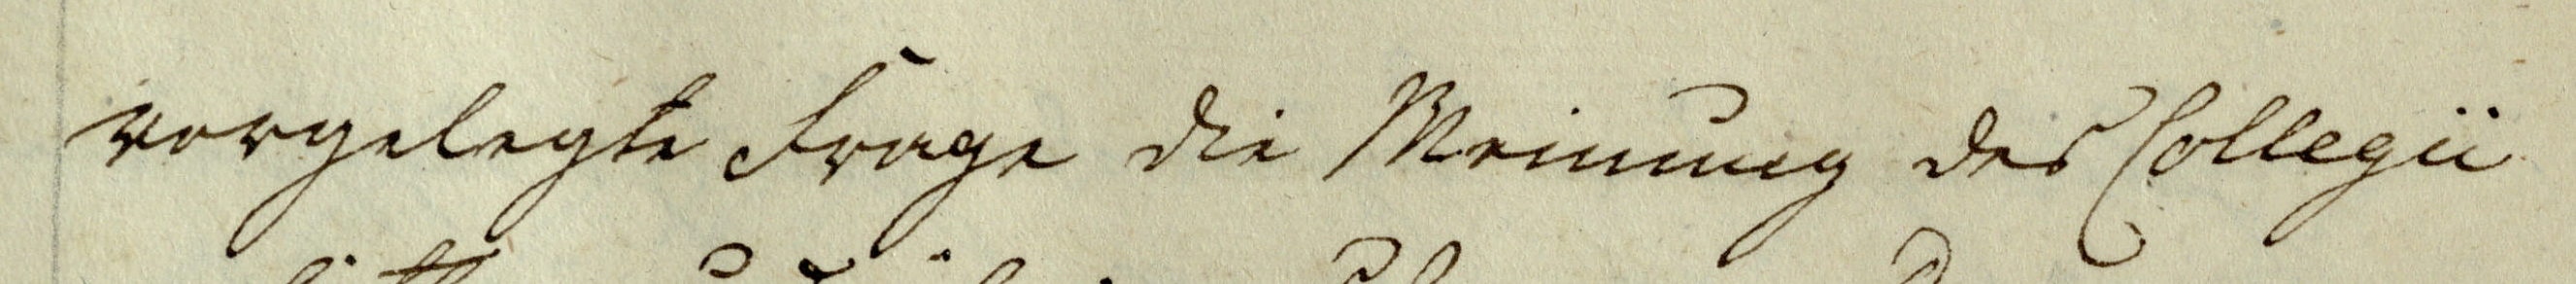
vorgelegte Frage die Meinung des Collegii
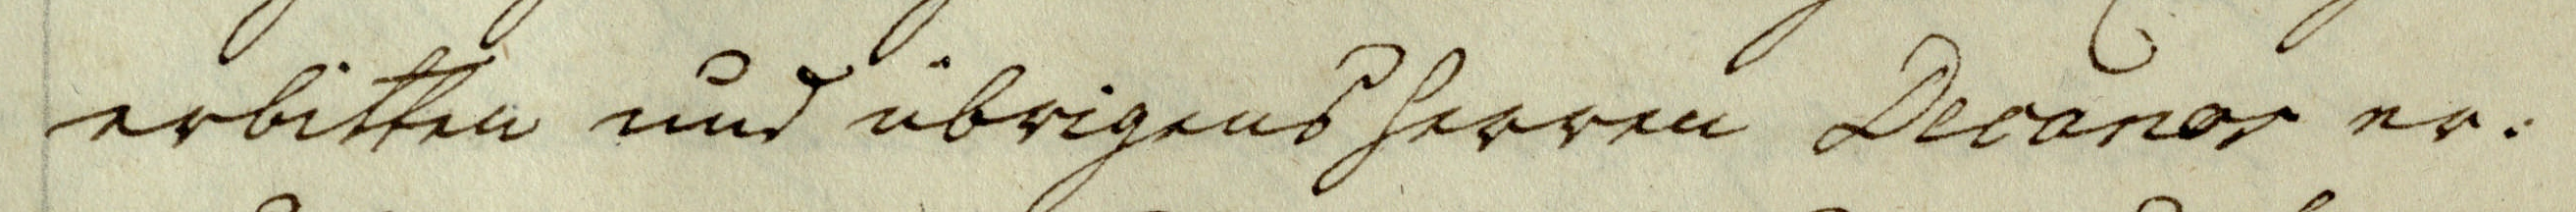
erbitten und übrigens Herren Decanos er¬
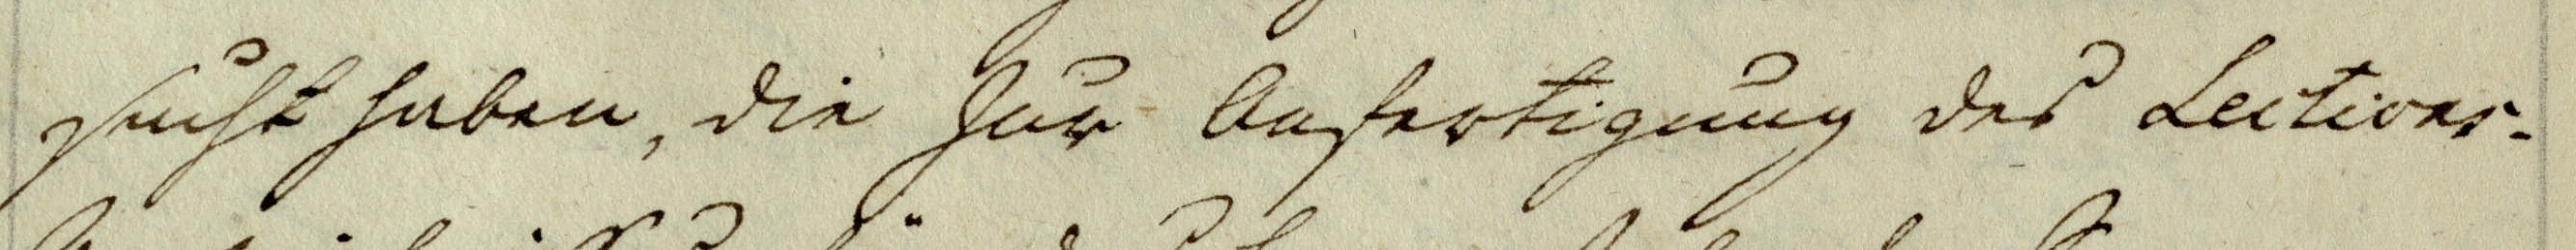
sucht haben, die zur Anfertigung des Lections¬
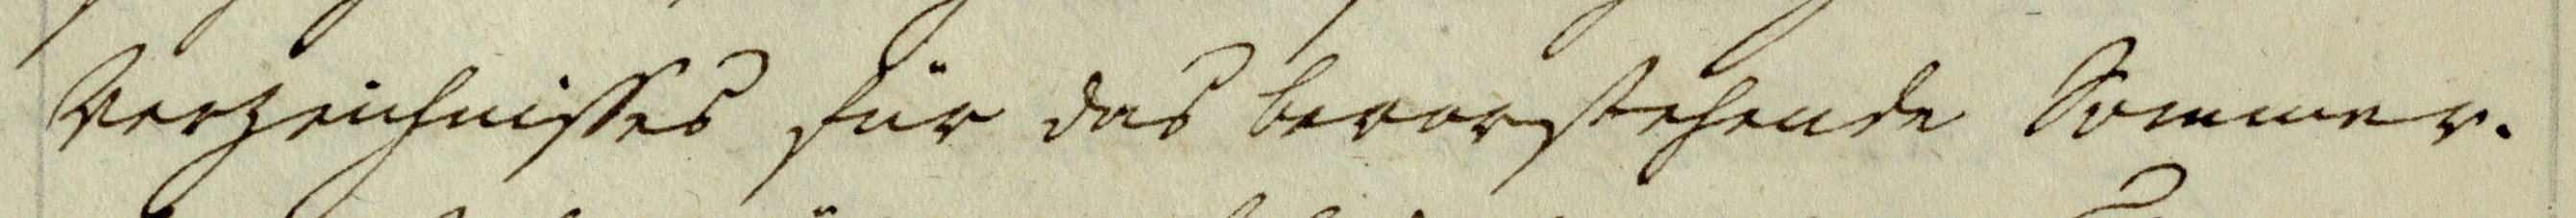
Verzeichnisses für das bevorstehende Sommer¬
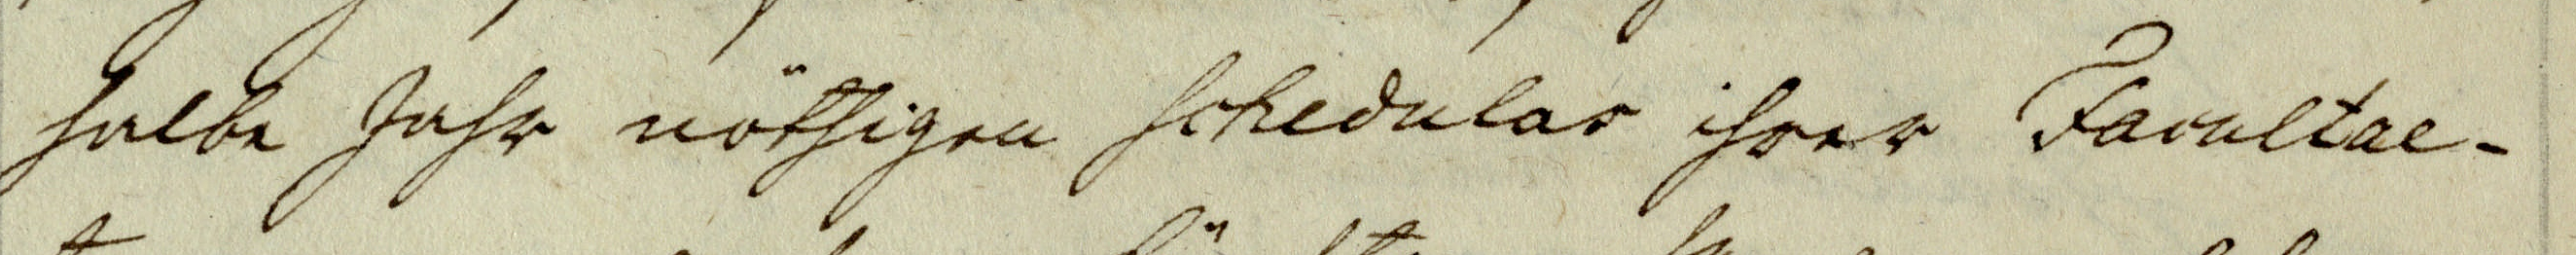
halbe Jahr nöthigen Schedulas ihrer Facultae¬
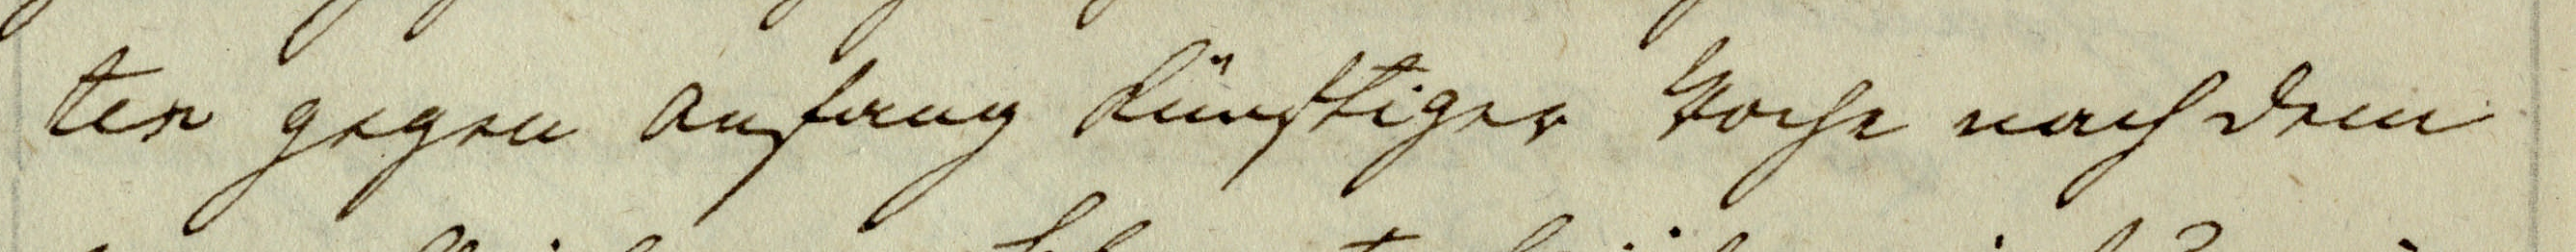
ten gegen Anfang künftiger Woche nach dem
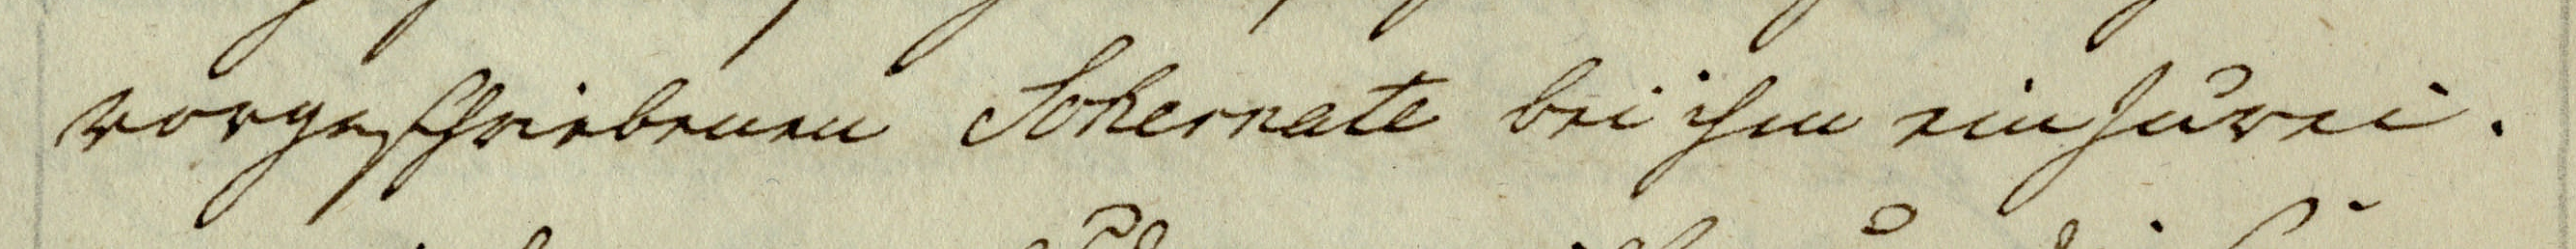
vorgeschriebenen Schemate bei ihm einzurei¬
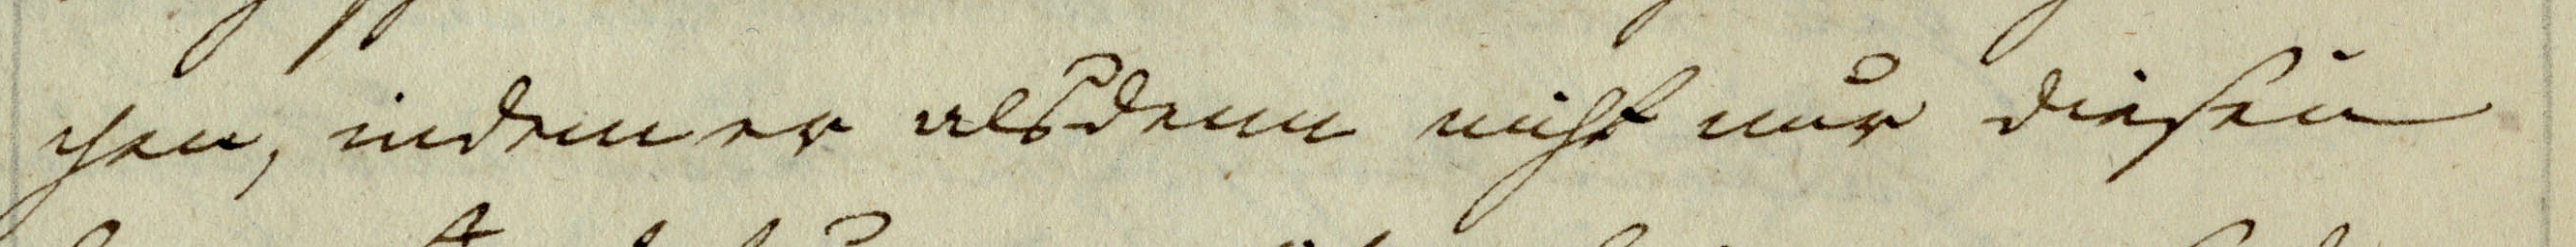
chen, indem er alsdenn nicht nur diesen
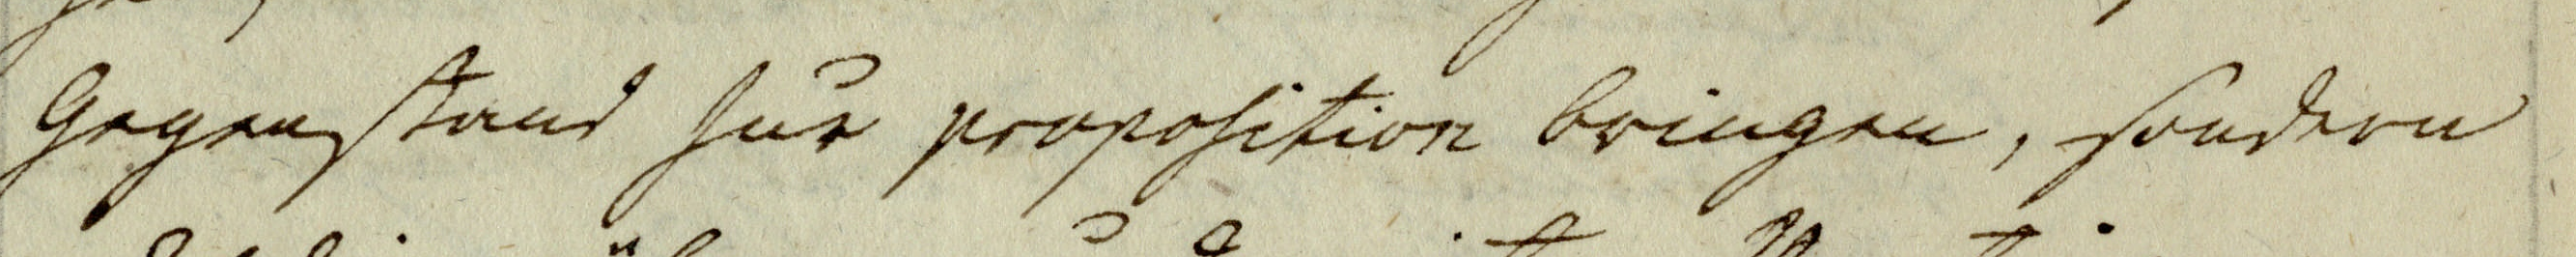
Gegenstand zur proposition bringen, sondern
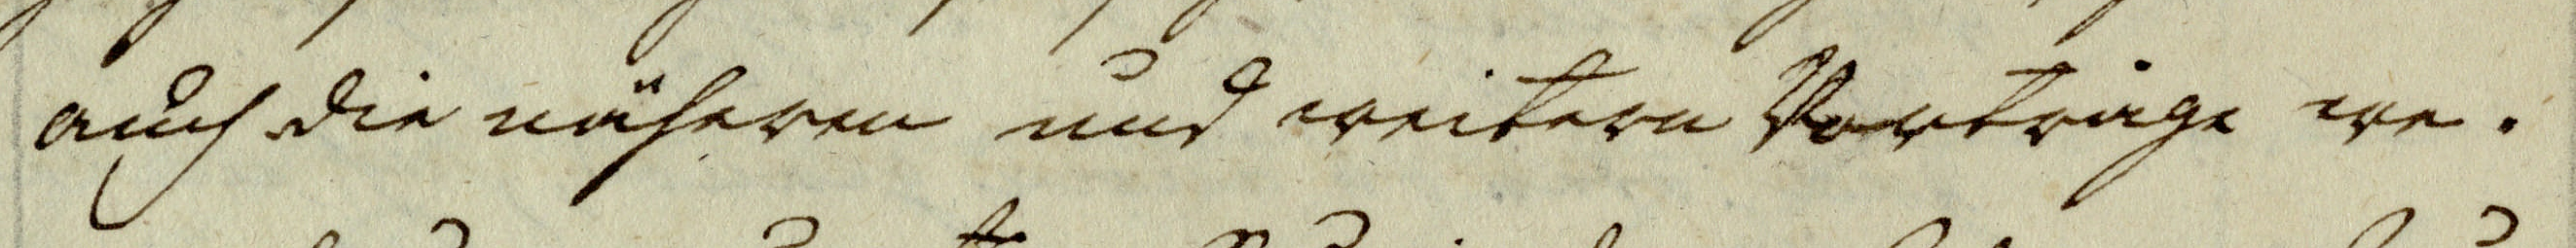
auch die näheren und weitern Vorträge we¬
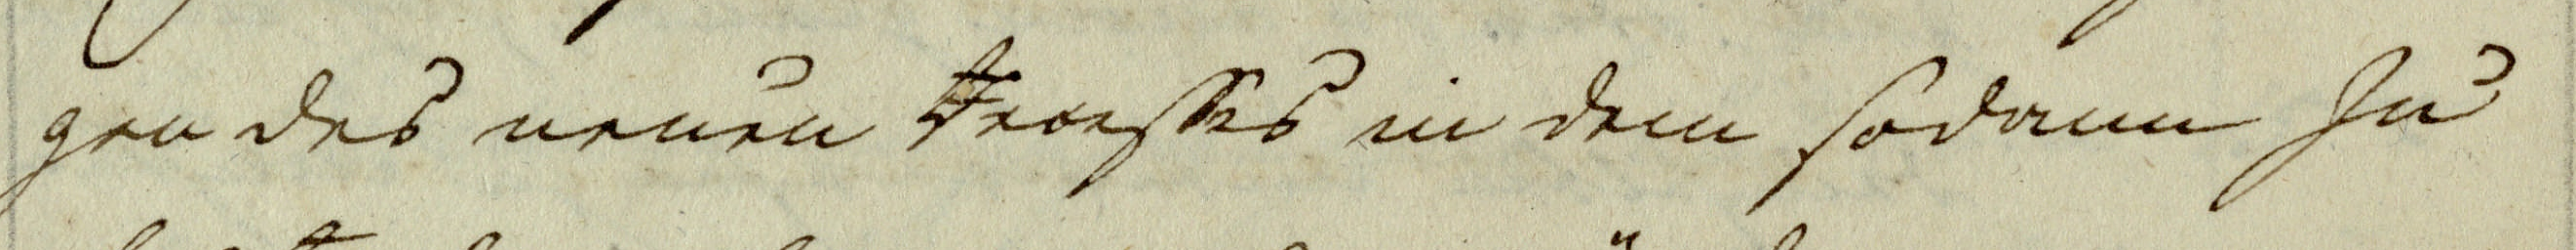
gen des neuen Recesses in dem sodann zu
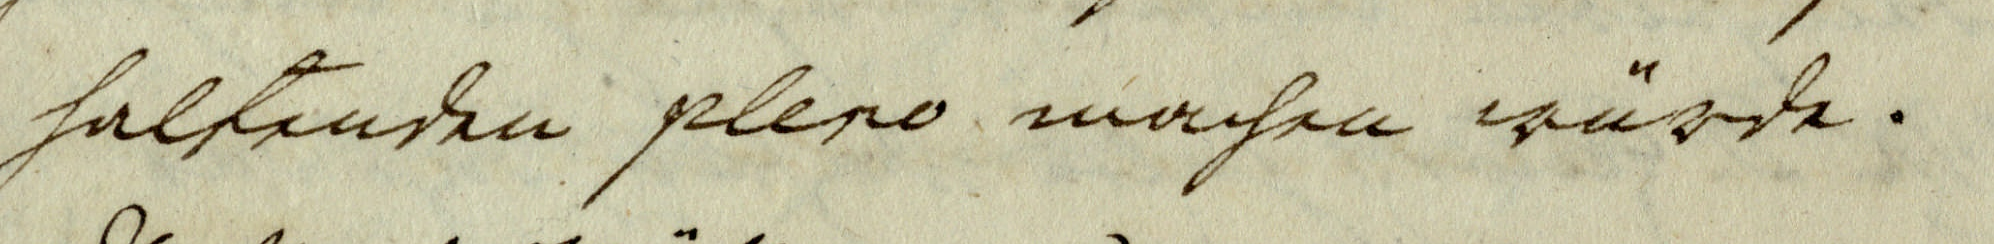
haltenden pleno machen würde.
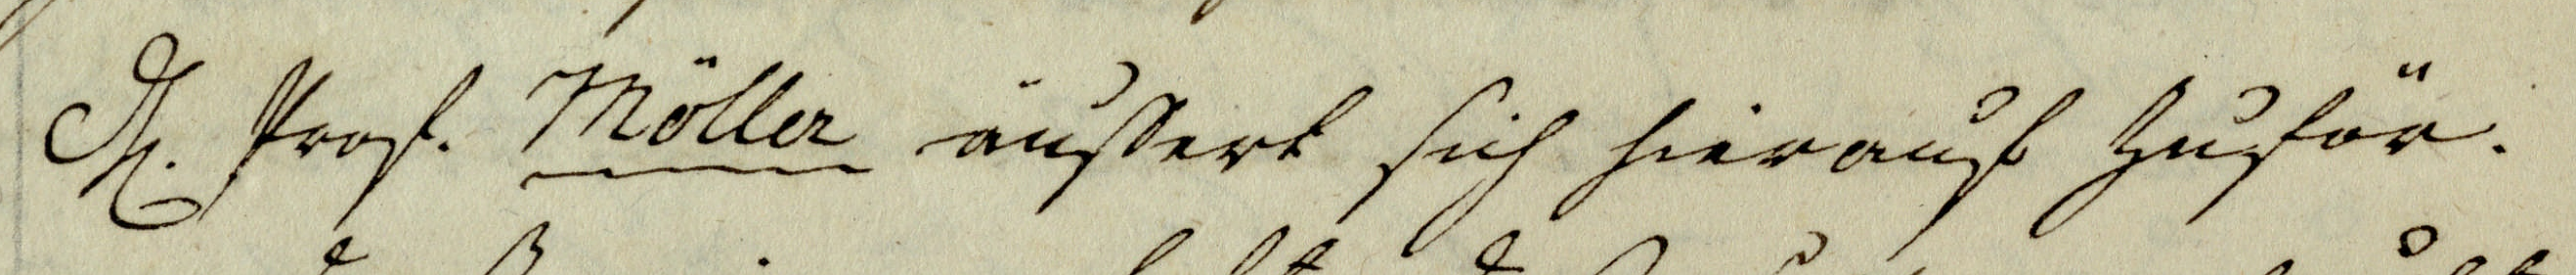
dh. Prof. Möller äussert sich hierauf zuför¬
